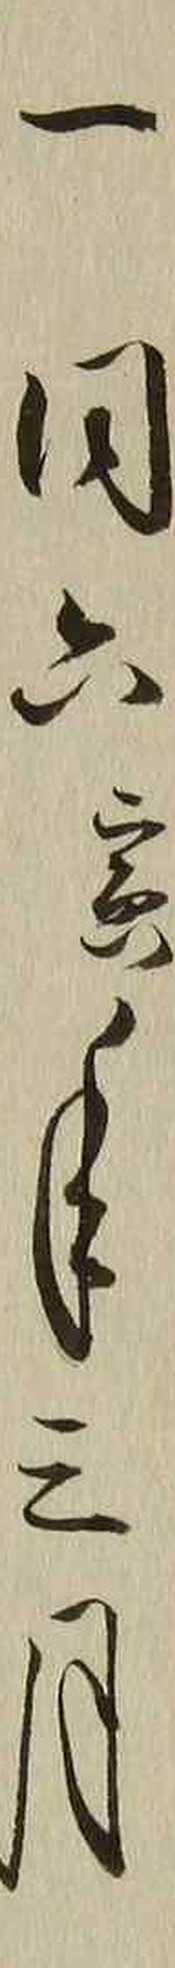一同六寅年三月
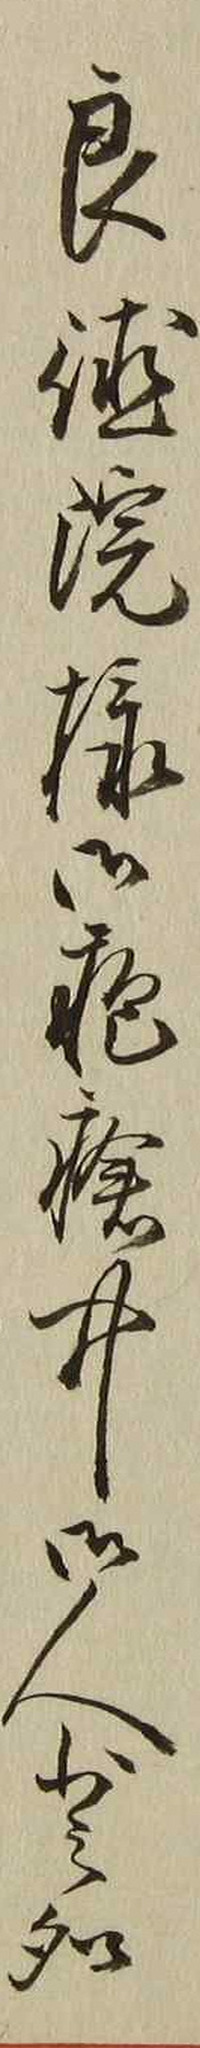良徳院様御疱瘡中御人少之処
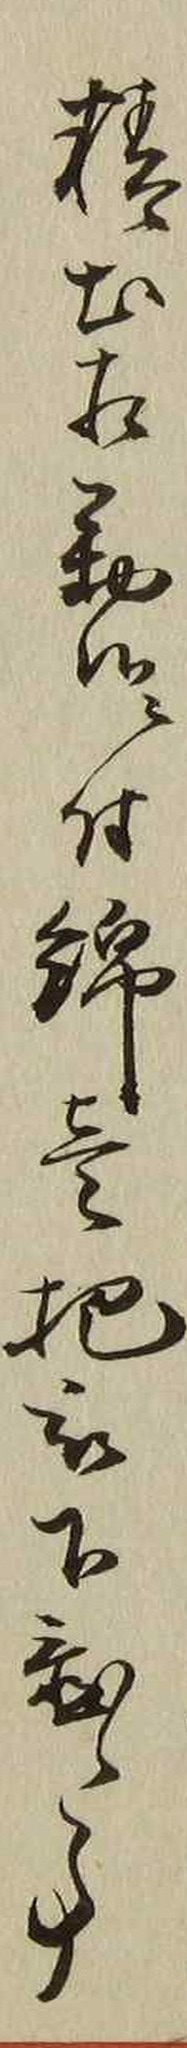精出相勤候ニ付綿壱把被下置候事
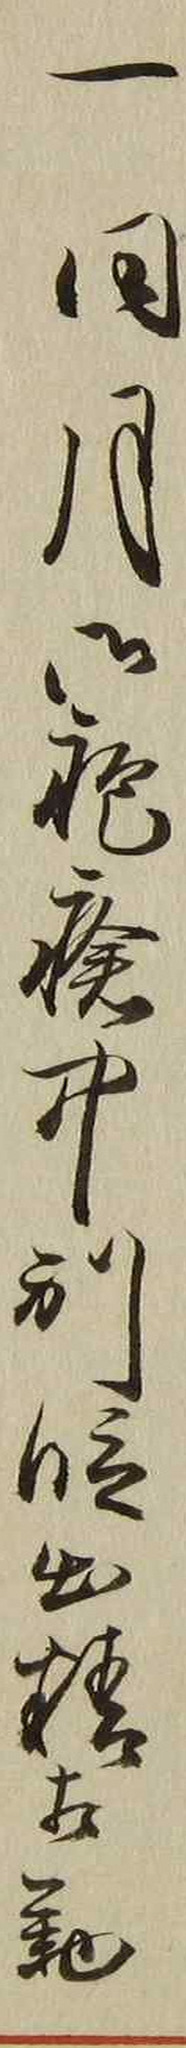一同月御疱瘡中別段出精相勤
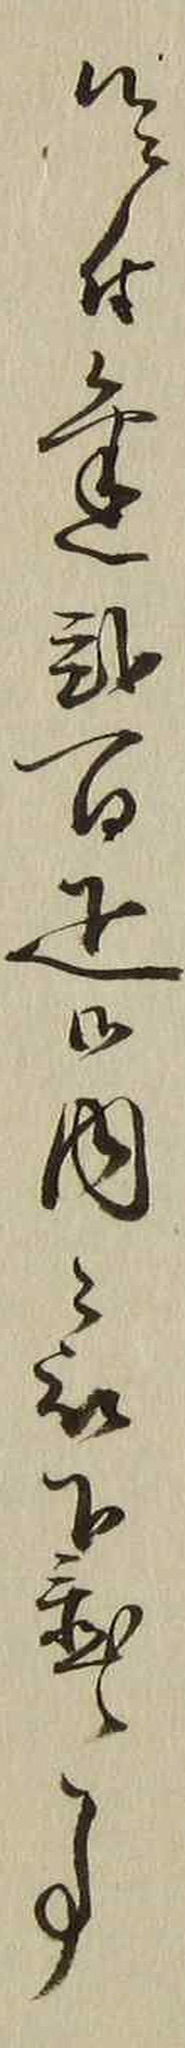候ニ付金弐百疋御内々被下置候事
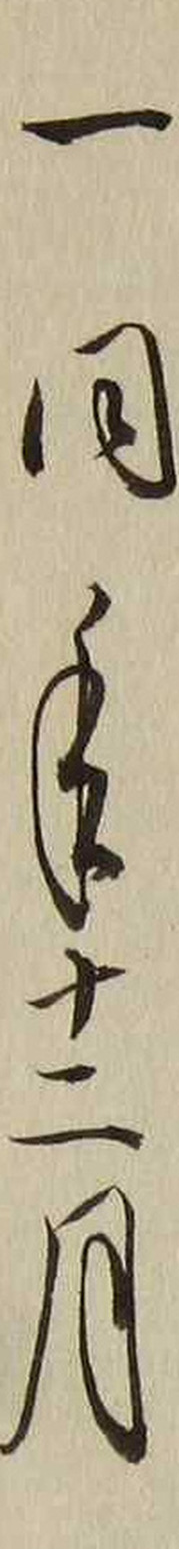一同年十二月
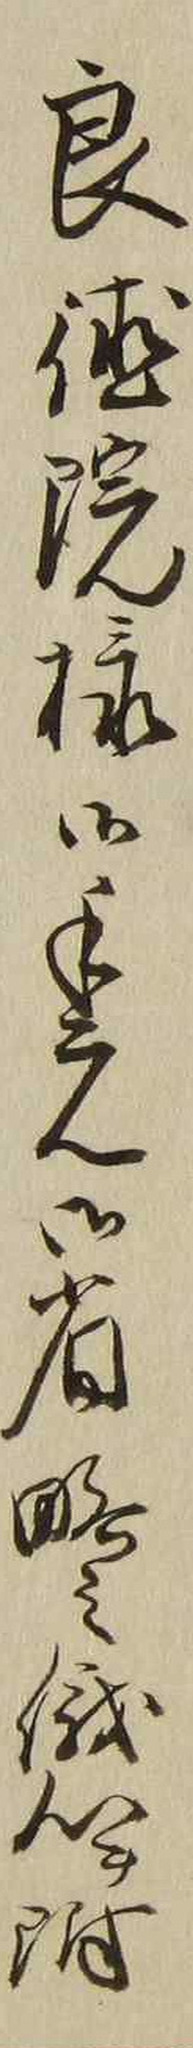良徳院様御手元御省略之儀心ヲ附
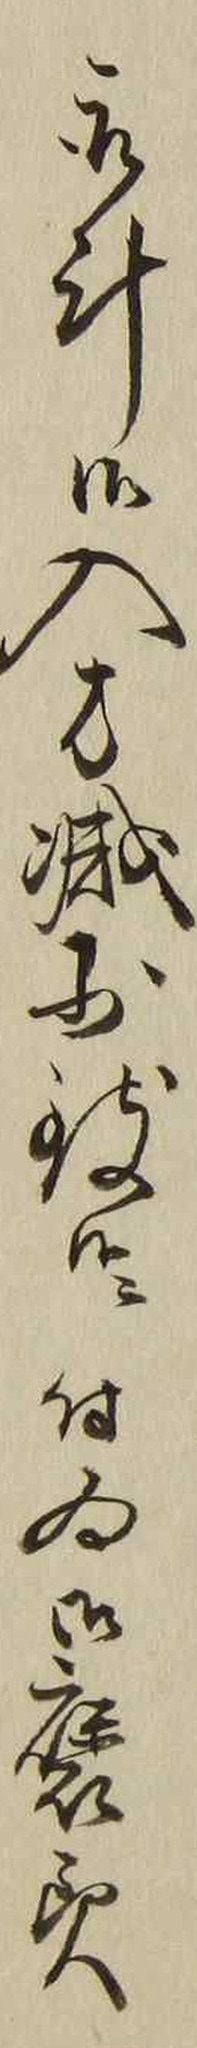取計御入方減少致候ニ付為御褒美

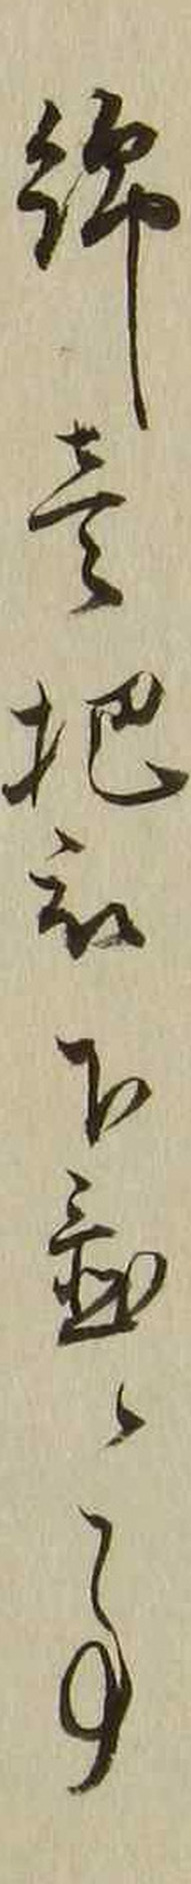綿壱把被下置候事
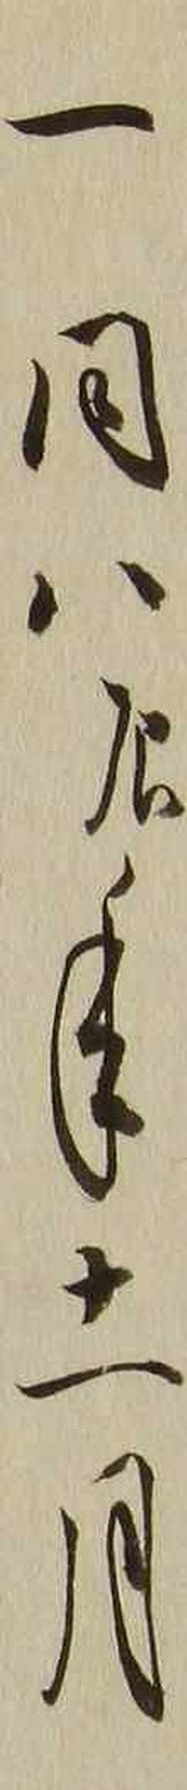一同八辰年十一月
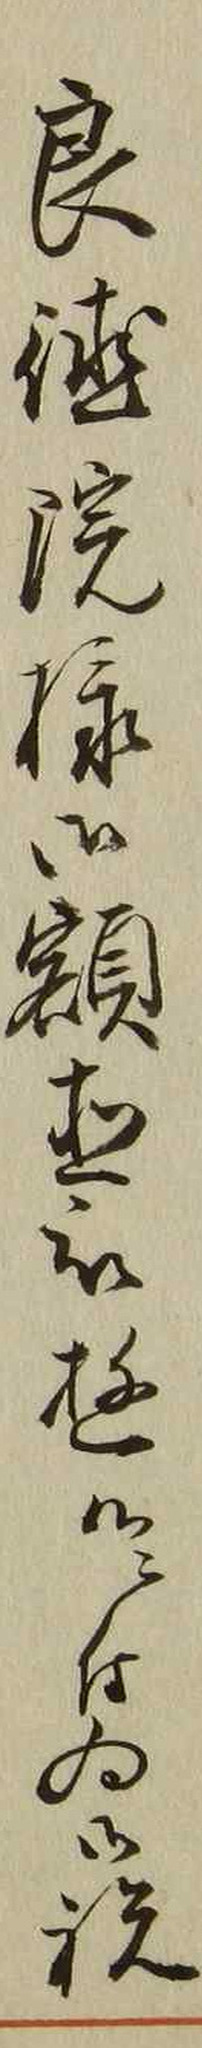良徳院様御額直被遊候ニ付為御祝
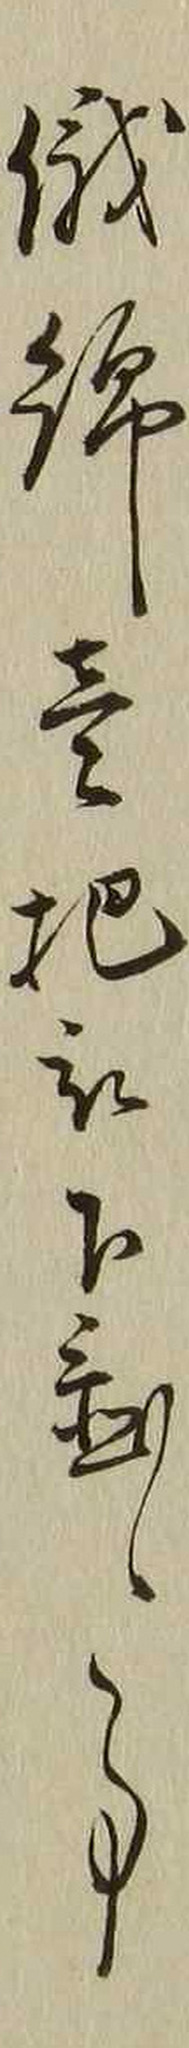綿壱把被下置候事
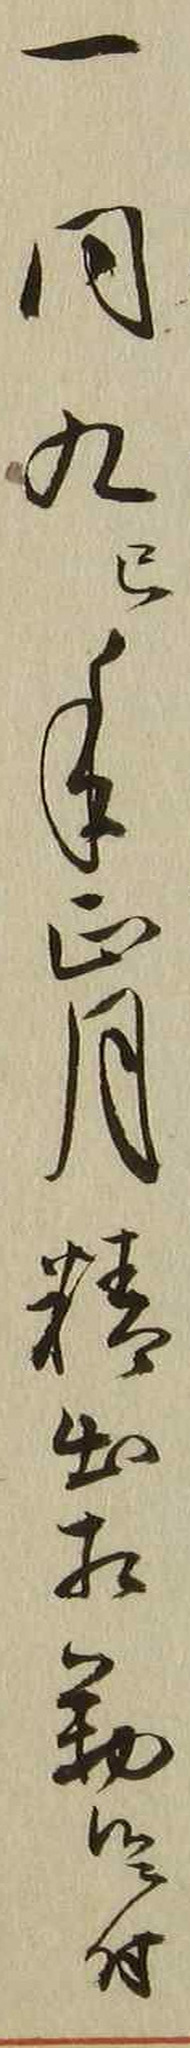一同九巳年正月精出相勤候ニ付
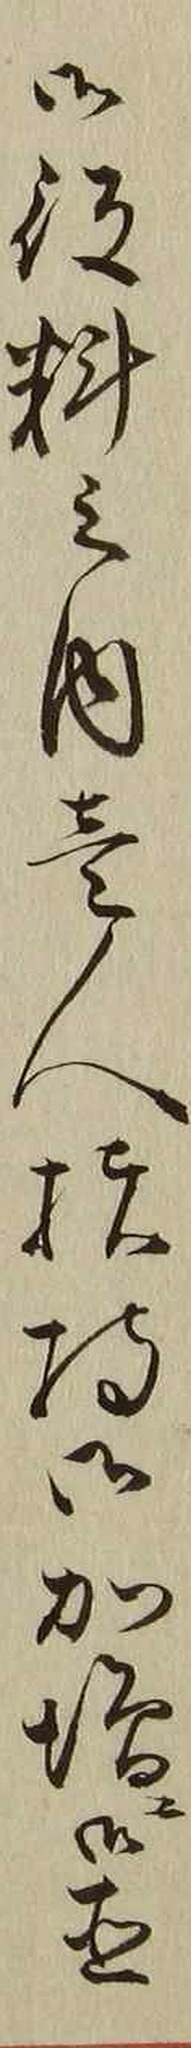御役料之内壱人扶持御加増ニ御直
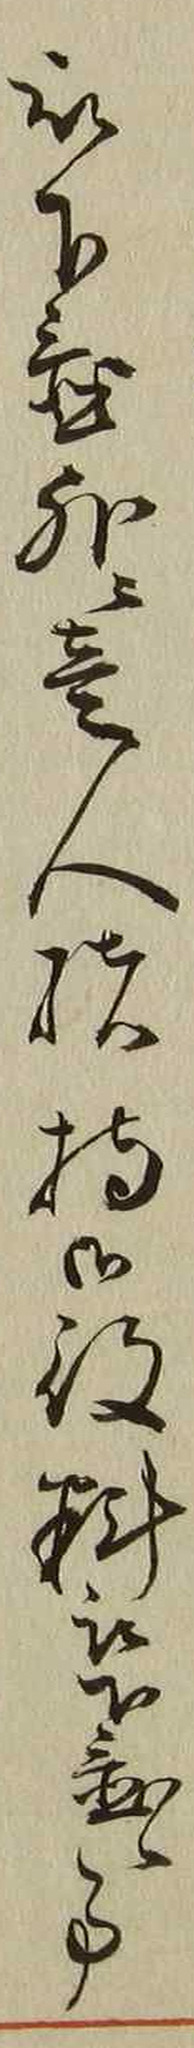被下置外ニ壱人扶持御役料被下置候事
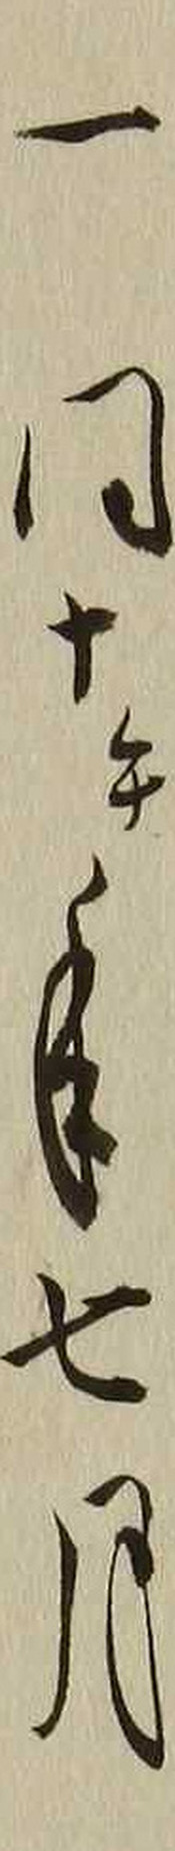一同十午年七月
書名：諸士系譜　巻之57　ほ之部4
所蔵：会津若松市立会津図書館
